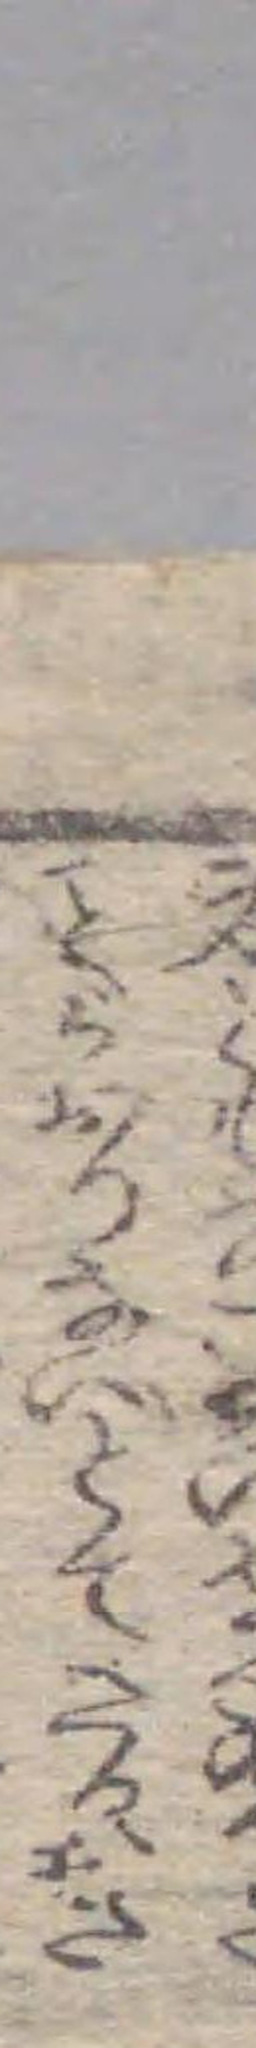ことがおりないとてさるおさ
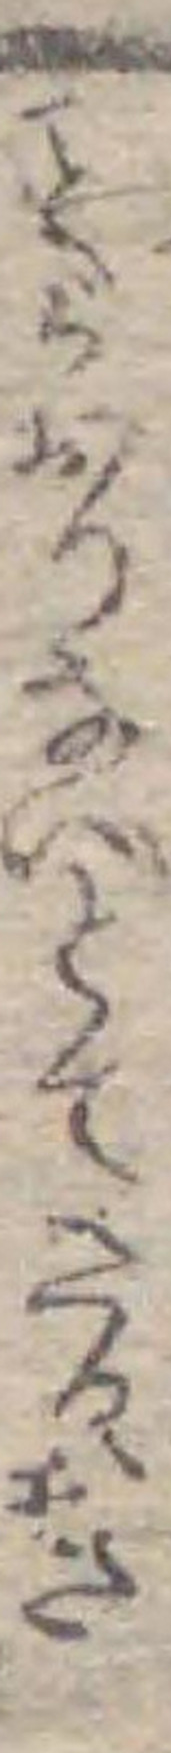ことがおりないとてさるおさ
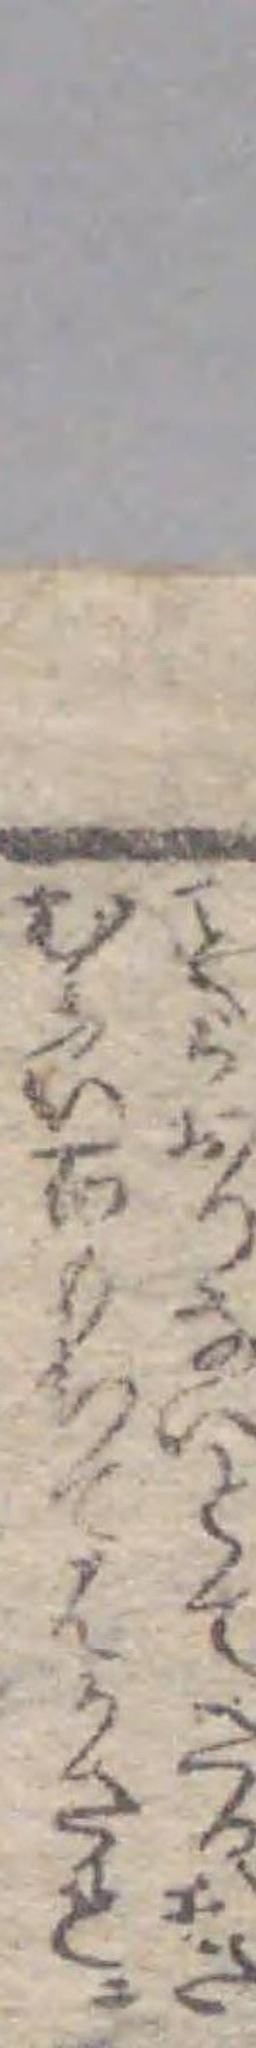むらい百もちてはかされに
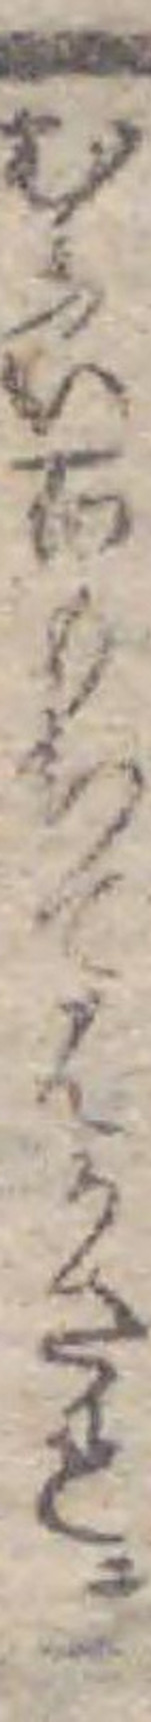むらい百もちてはかされに
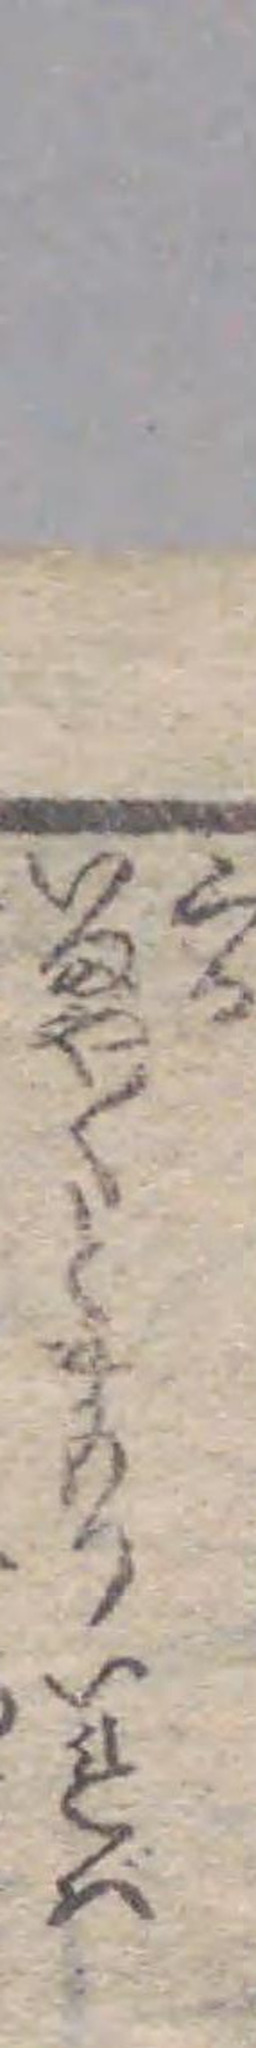いまや〳〵とまもりいれば
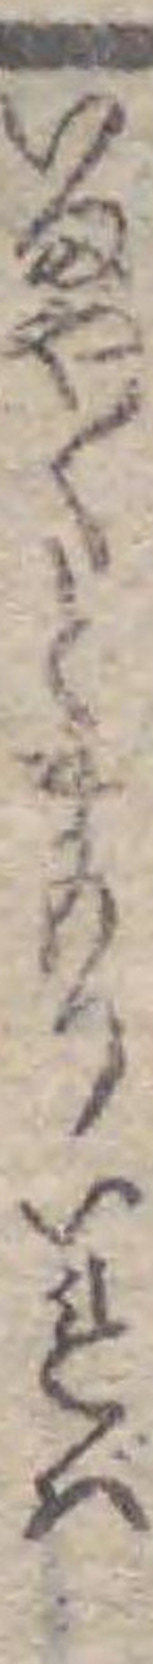いまや〳〵とまもりいれば
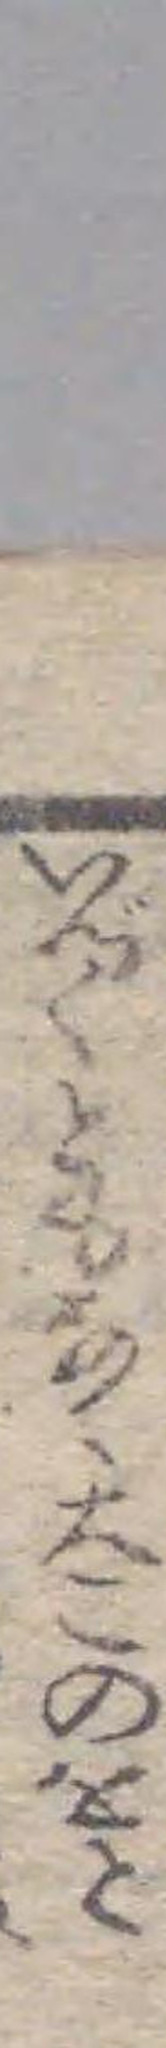いづくともなく大このをと
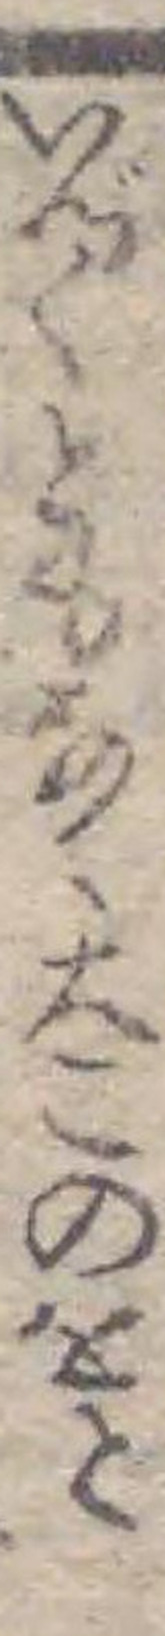いづくともなく大このをと
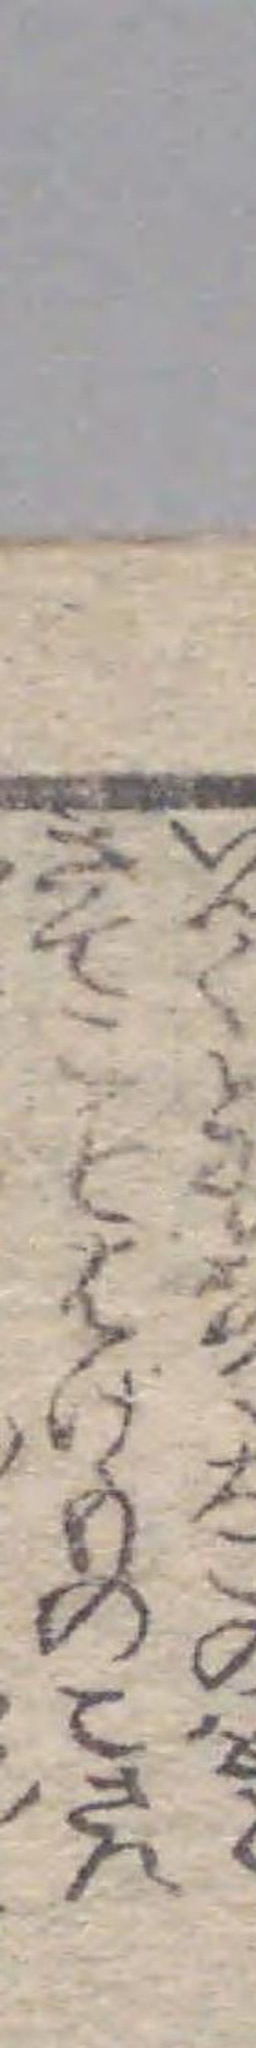さてこそはけものこさへ
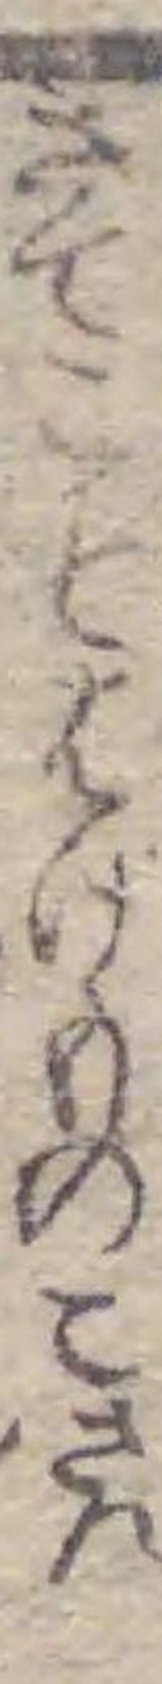さてこそはけものこさへ
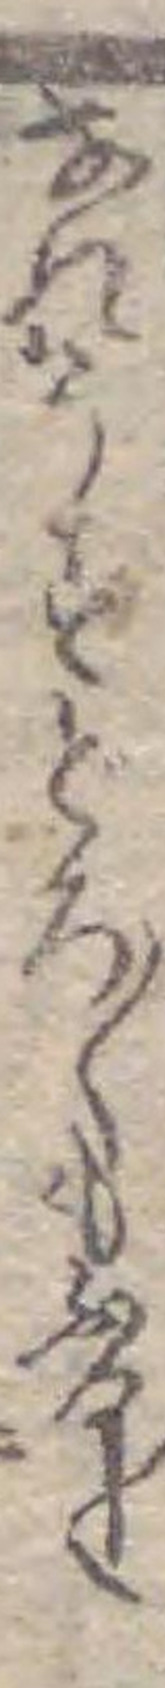なれうすどろ〳〵もふる〳〵
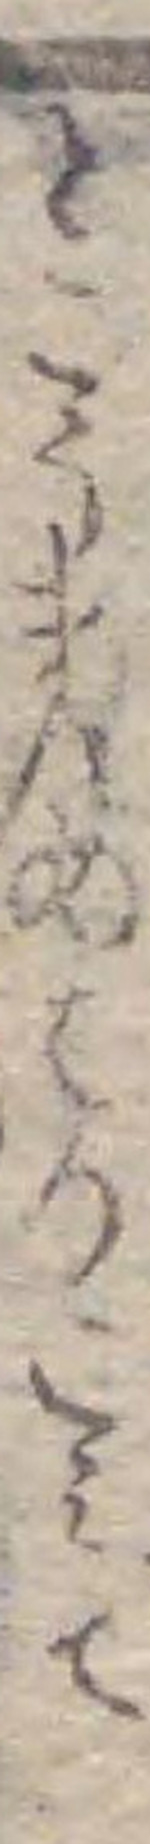とこうまんめはりこみにて
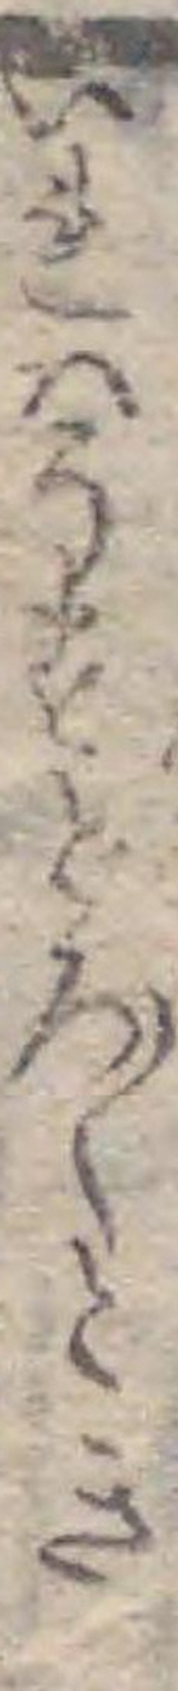いれはうすどろ〳〵とき
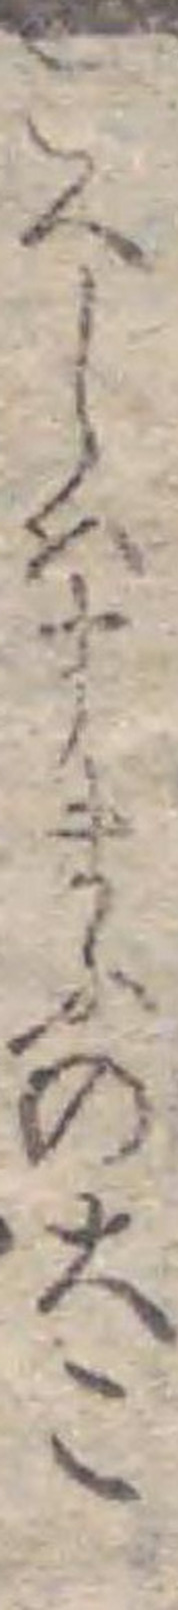こへしはすまふの大こ
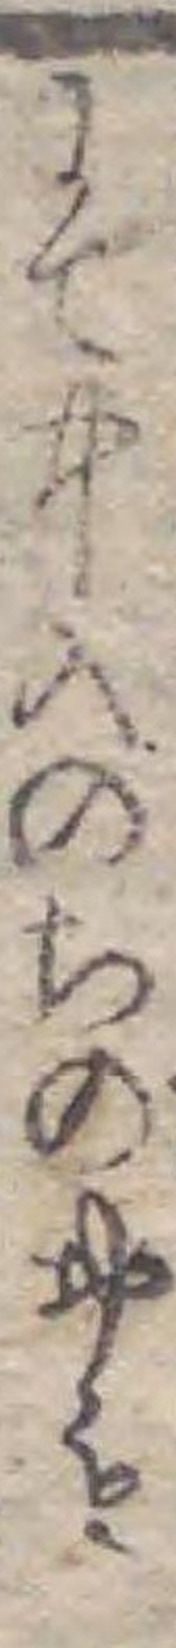にて中入のちのおも
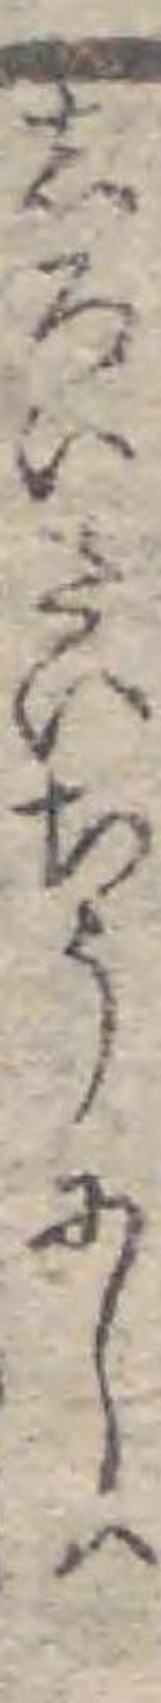しろいさいちうにしは
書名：紺屋百物語 : 3巻
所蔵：国立国会図書館 National Diet Library, JAPAN
